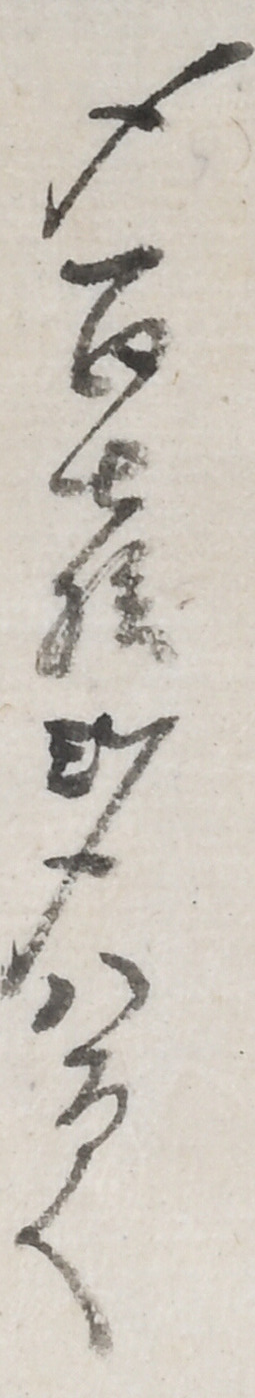〆百七拾弐〆八百文
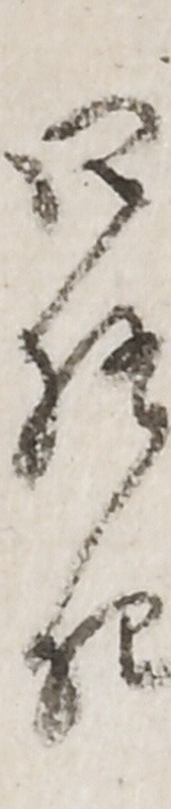四拾把
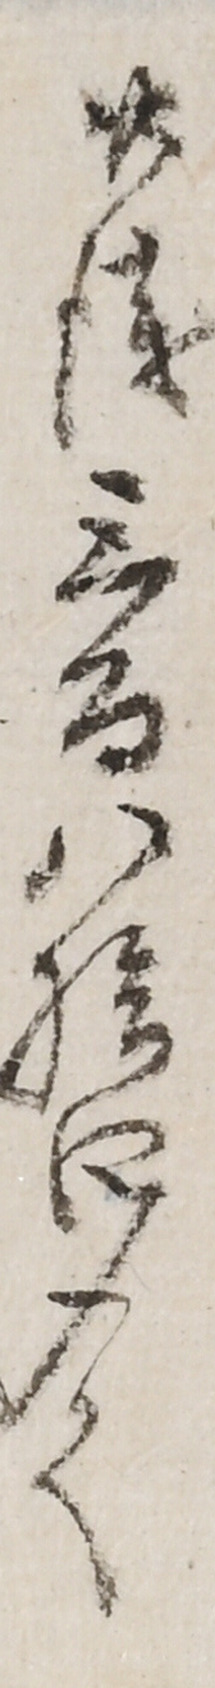此銭三百八拾四〆文
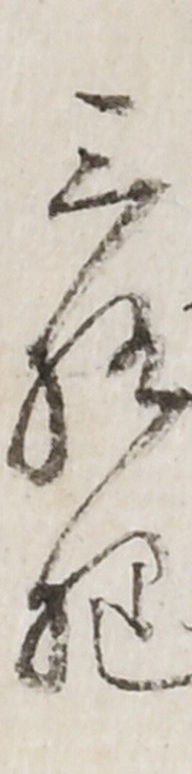三拾把
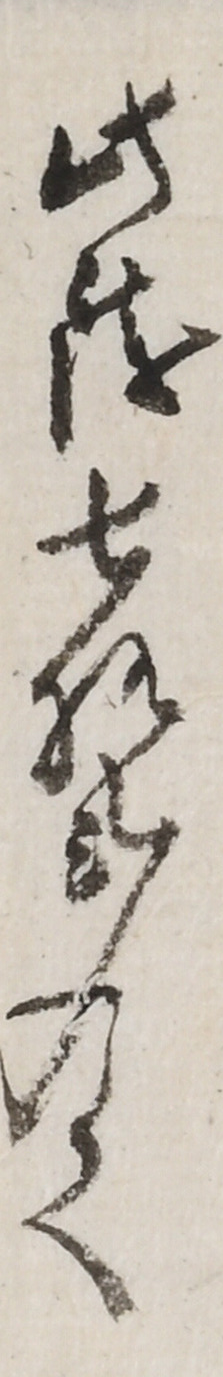此銭七拾弐〆文
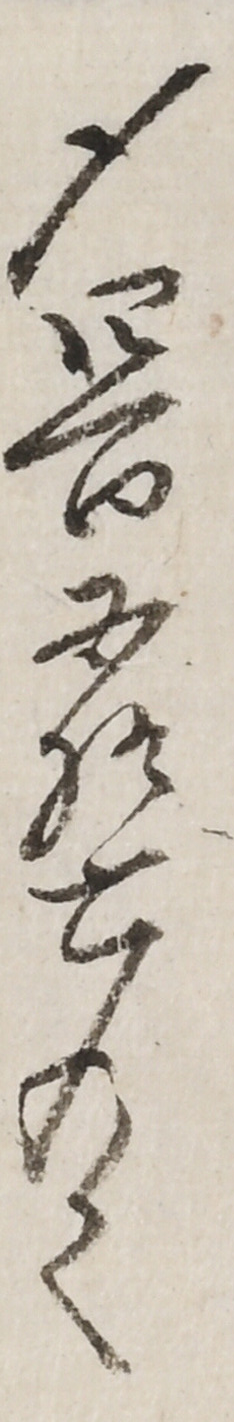〆四百五拾六〆文
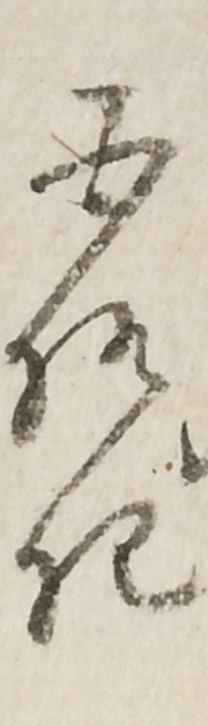五拾把
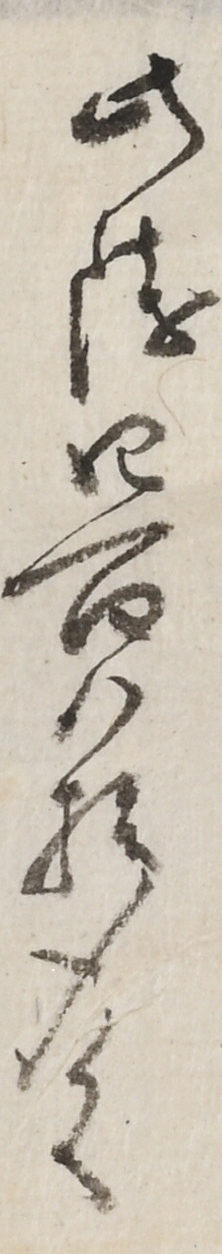此銭四百八拾〆文

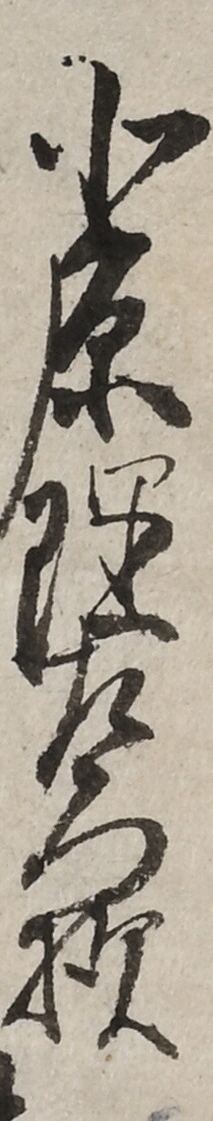北原理左衛門様
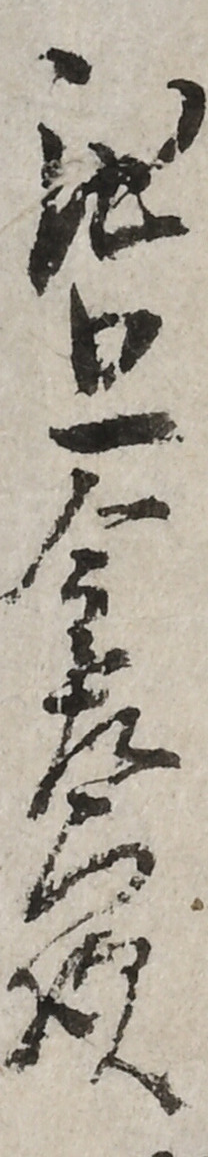池上金左衛門様
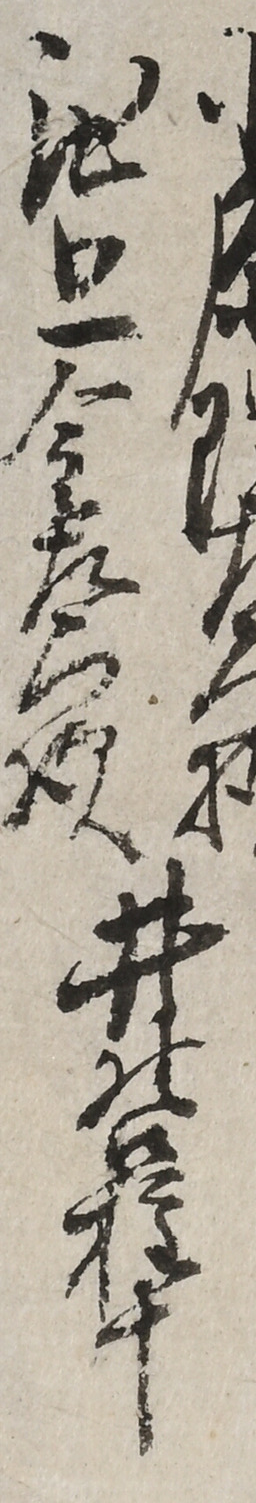池上金左衛門様

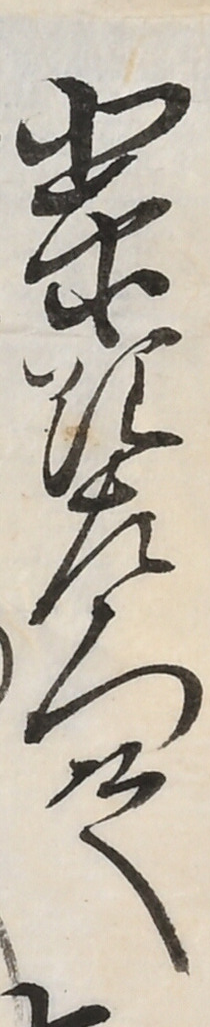北原次左衛門殿
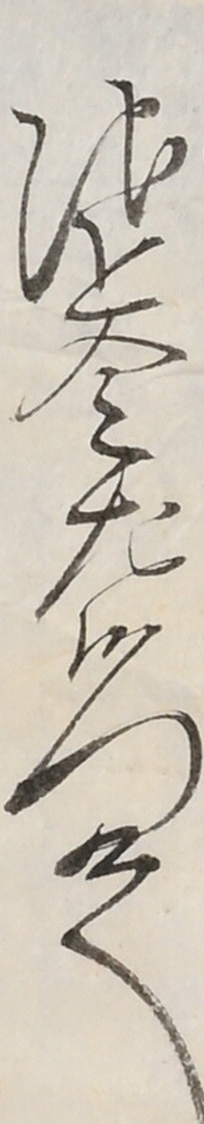池上金左衛門殿
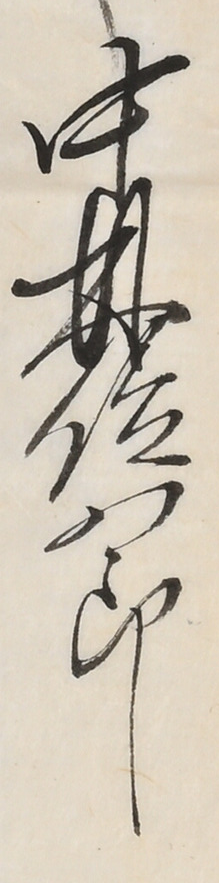中林信八郎

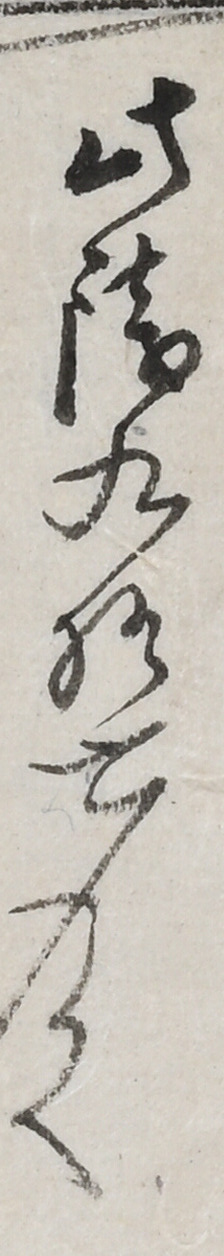此銭九拾六〆文
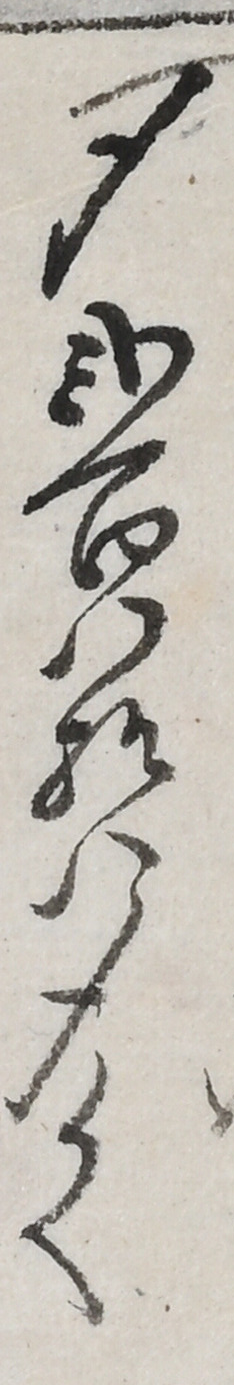〆弐百八拾八〆文
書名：信濃全國楮幣引換御用控
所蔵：伊那市立高遠町図書館・合同会社AMANE
